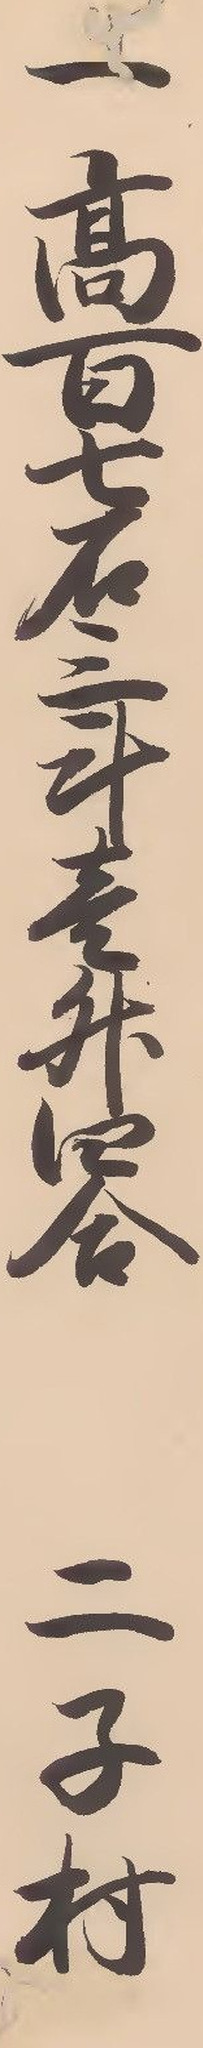一高百七石三斗壱升四合二子村
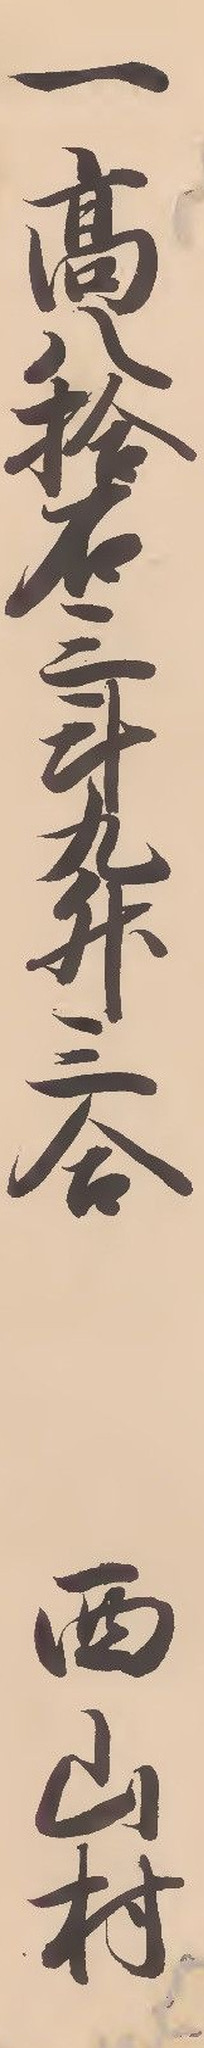一高八拾石三斗九升三合西山村

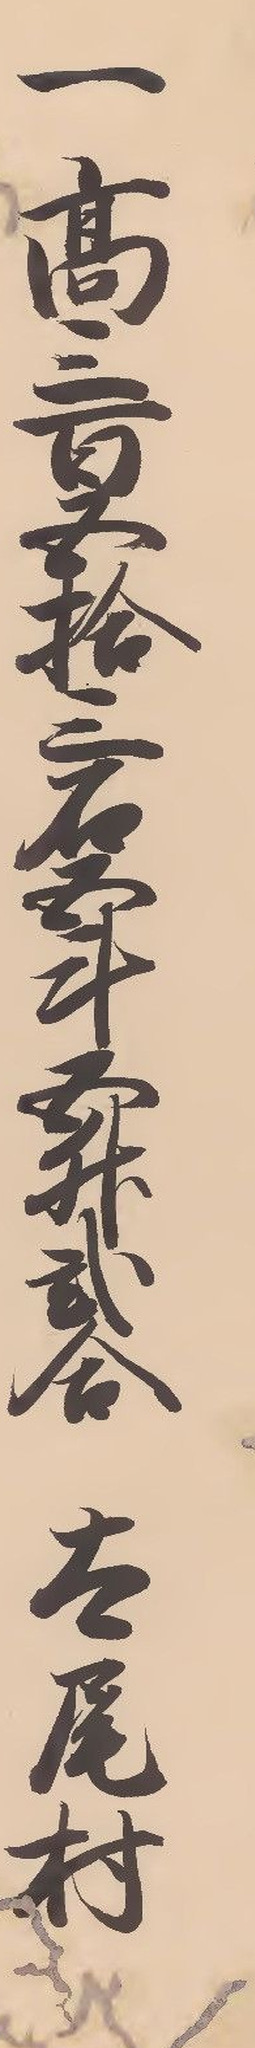一高三百五拾三石五斗五升弐合太尾村
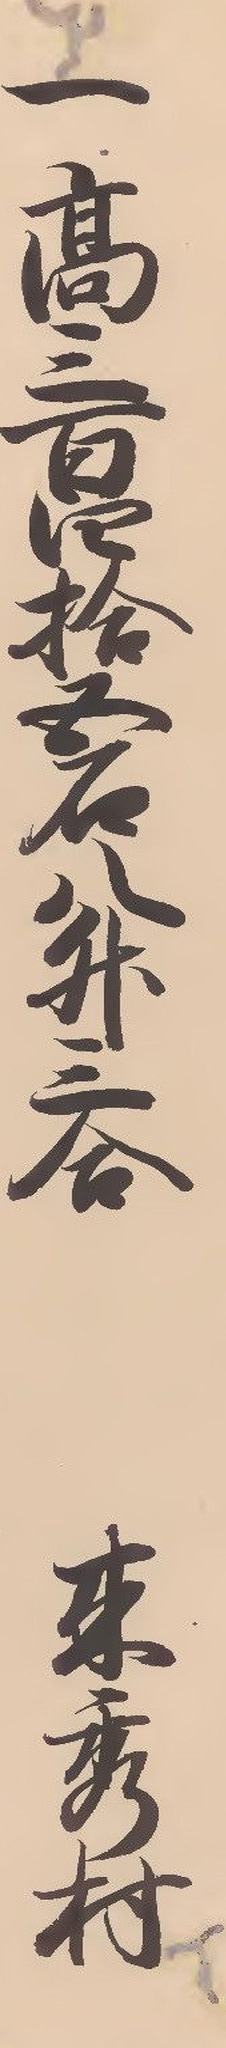一高三百四拾五石八升三合来秀村
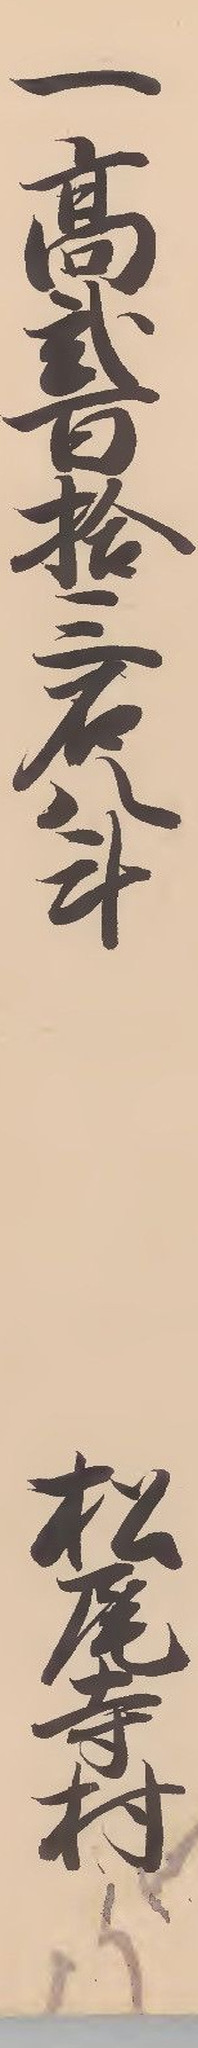一高弐百拾三石八斗松尾寺村
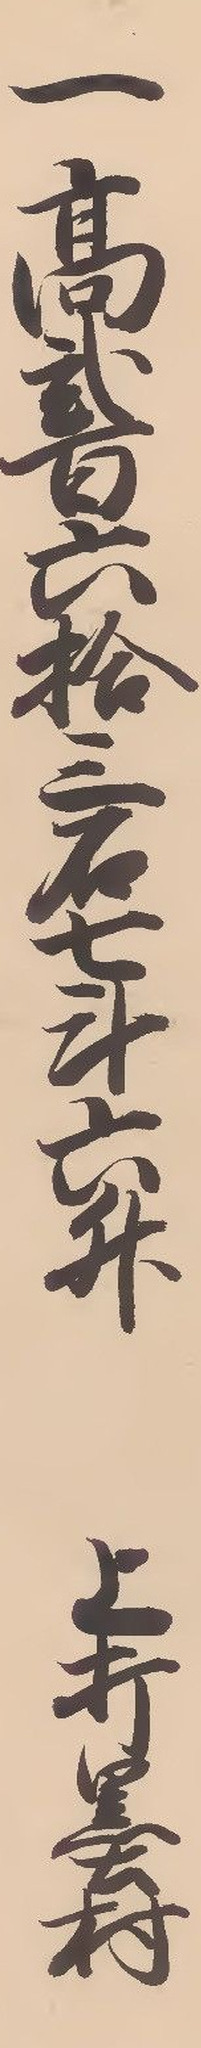一高弐百六拾三石七斗六升上打墨村
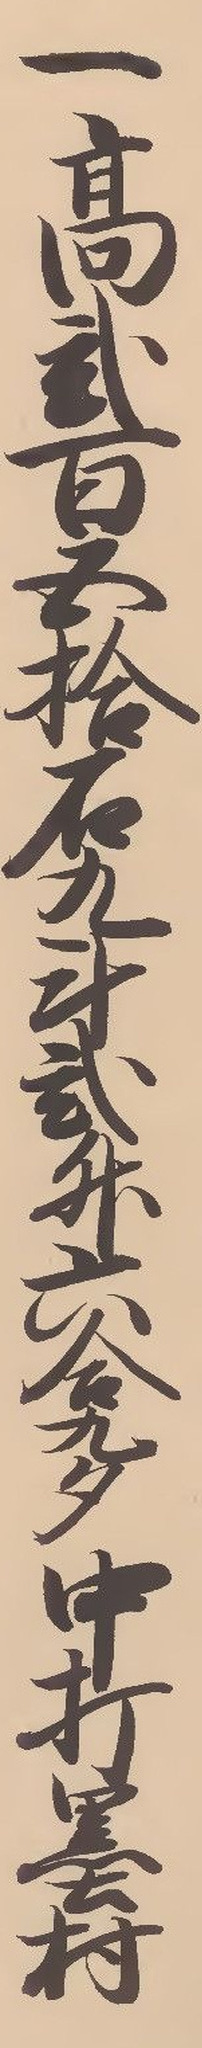一高弐百五拾石九斗弐升六合九勺中打墨村
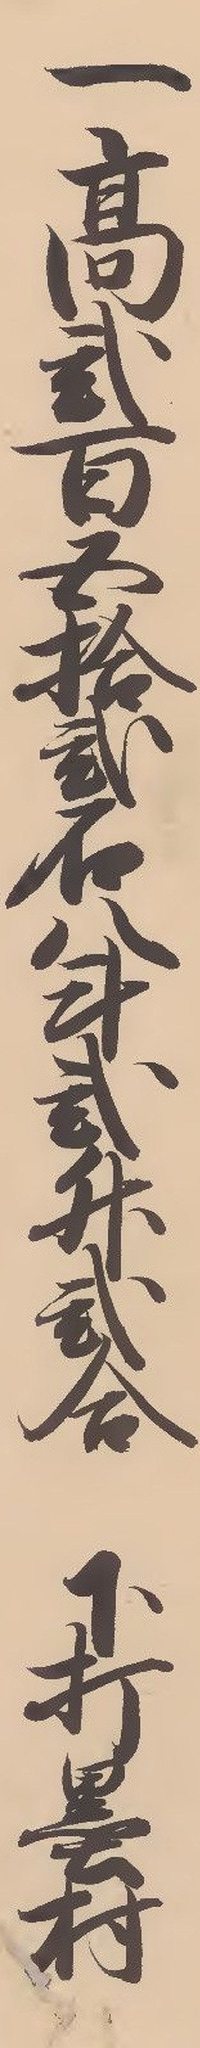一高弐百五拾弐石八斗弐升弐合下打墨村
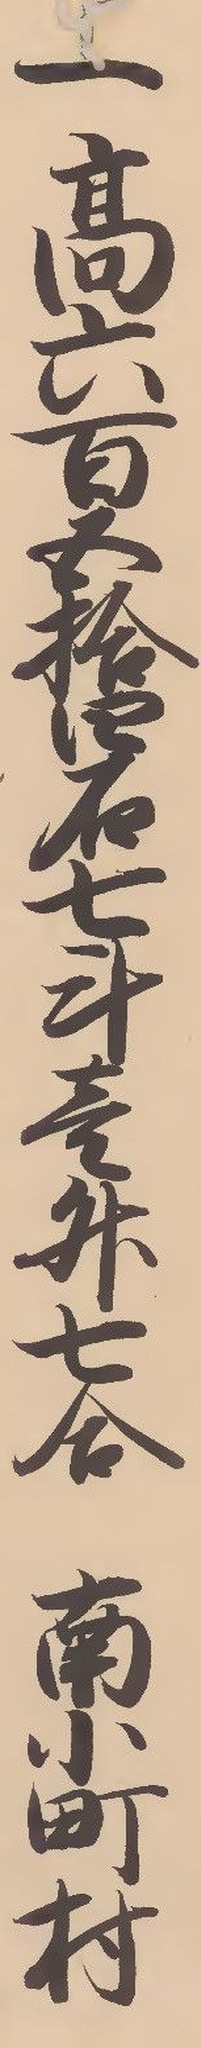一高六百五拾四石七斗壱升七合南小町村
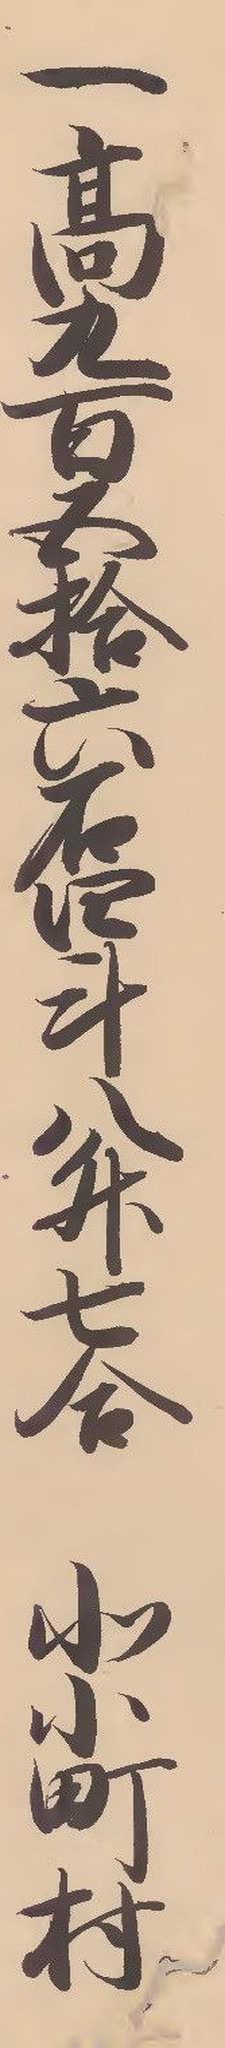一高九百五拾六石四斗八升七合北小町村

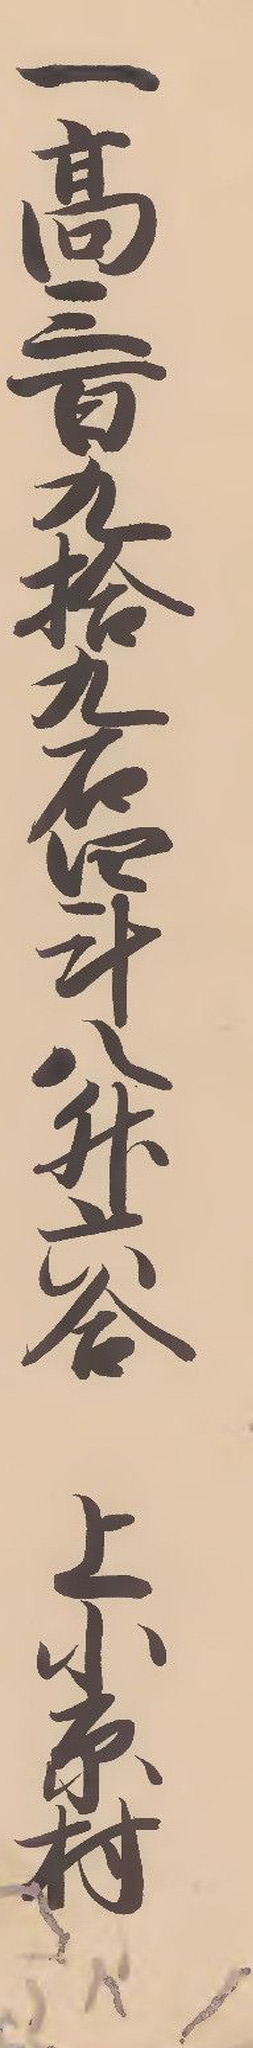一高三百九拾九石四斗八升六合上小原村
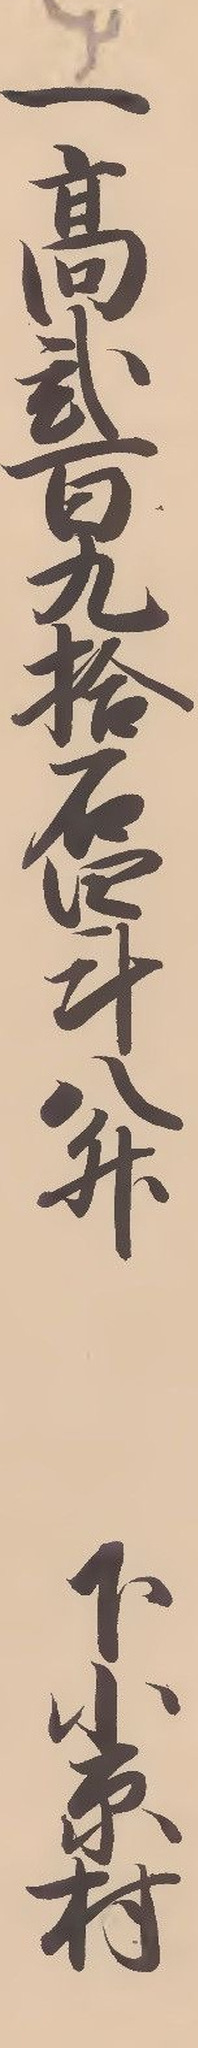一高弐百九拾石四斗八升下小原村
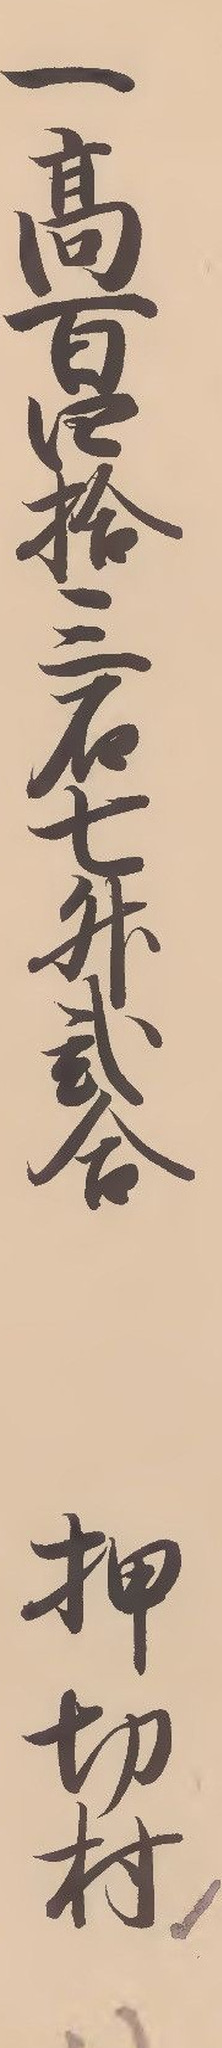一高百四拾三石七升弐合押切村
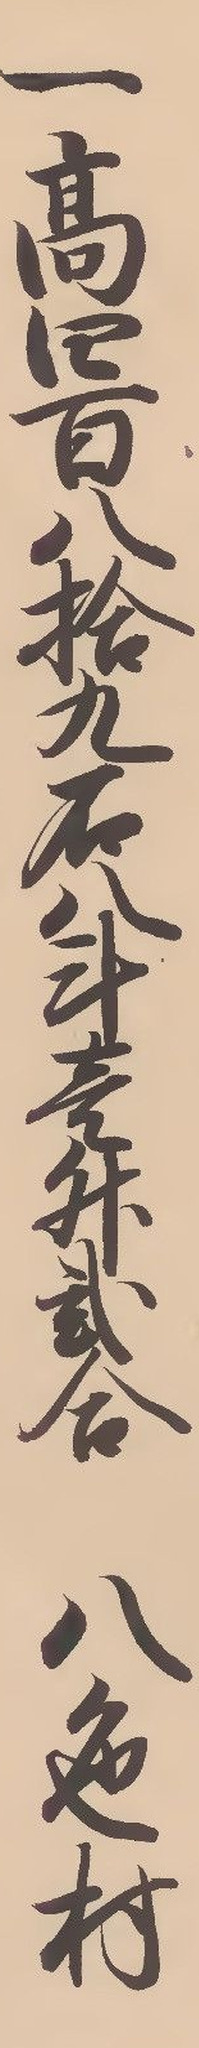一高四百八拾九石八斗壱升弐合八色村
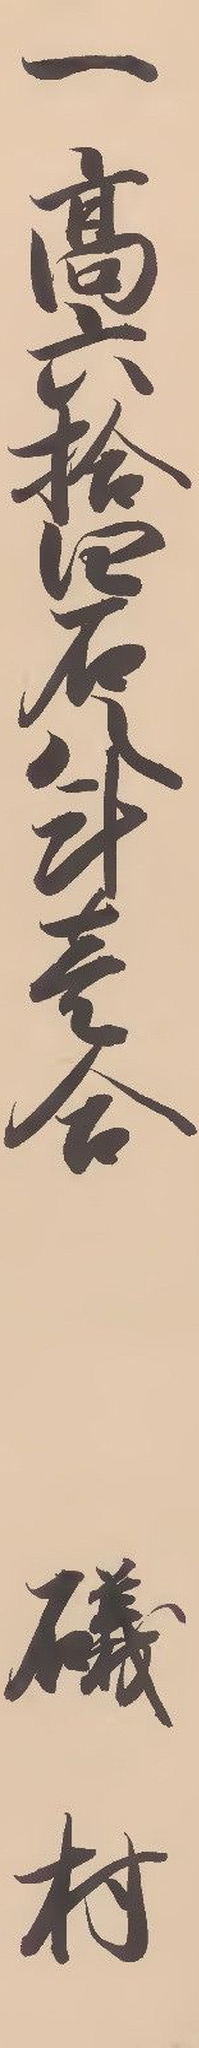一高六拾四石八斗壱合磯村
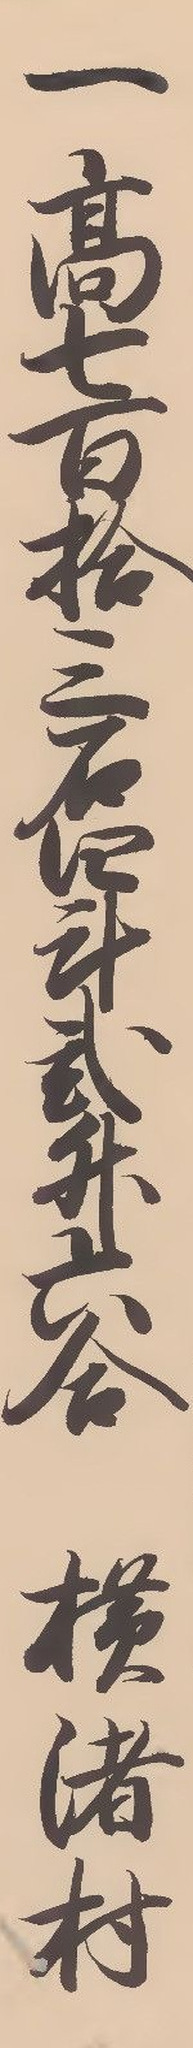一高七百拾三石四斗弐升六合横渚村
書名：安房国郷帳
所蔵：国立公文書館 National Archives of Japan
